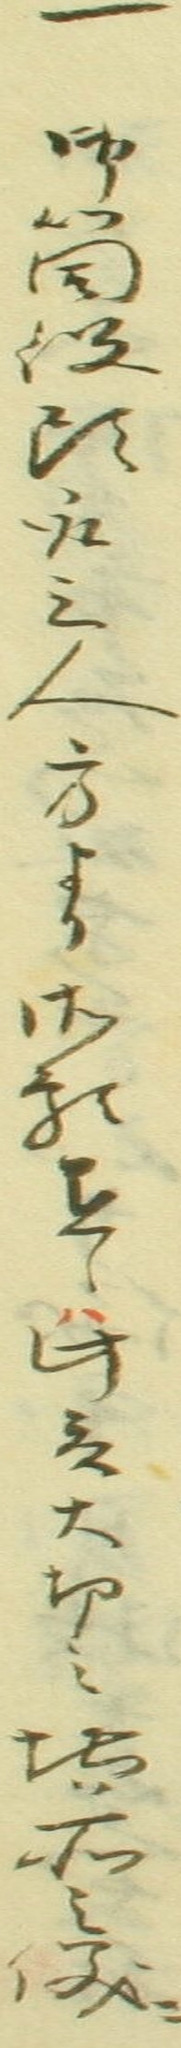一御筒役頭取三人方より御願置候は此度大切之場所之儀ニ
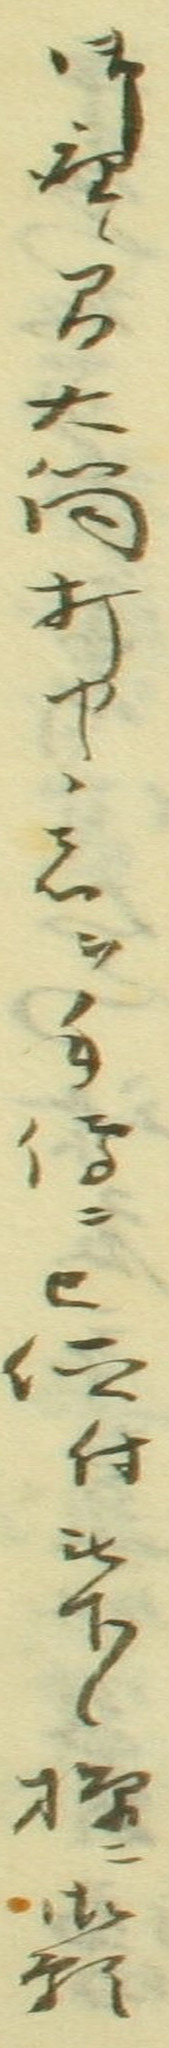御座之間大筒打申候者ヲ手伝ニ被仰付被下候様ニ御願
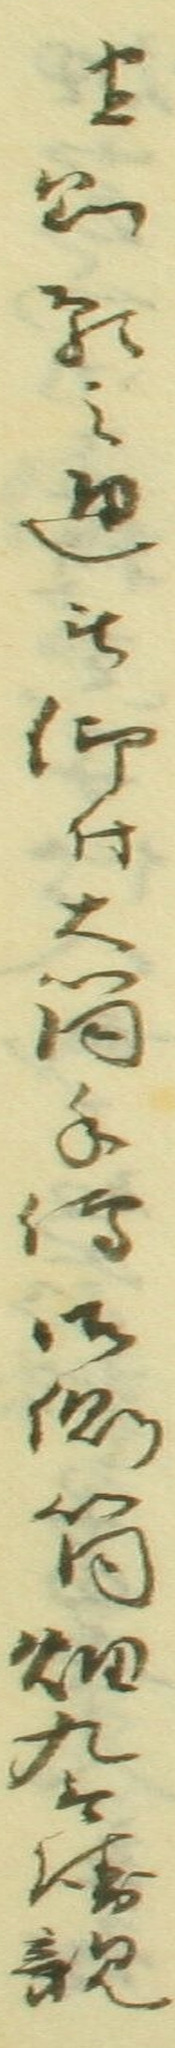宜御願之通被仰付大筒手伝御側筒畑九兵衛親

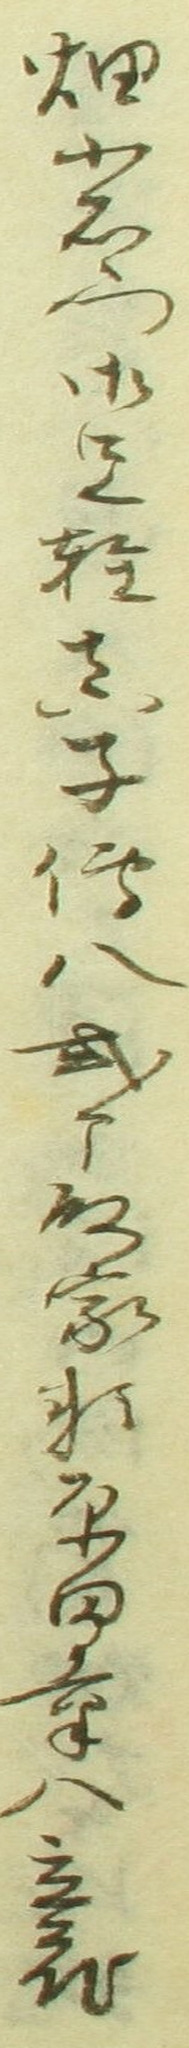畑小右衛門御足軽真子伝八式部殿家頼原田幸八立花
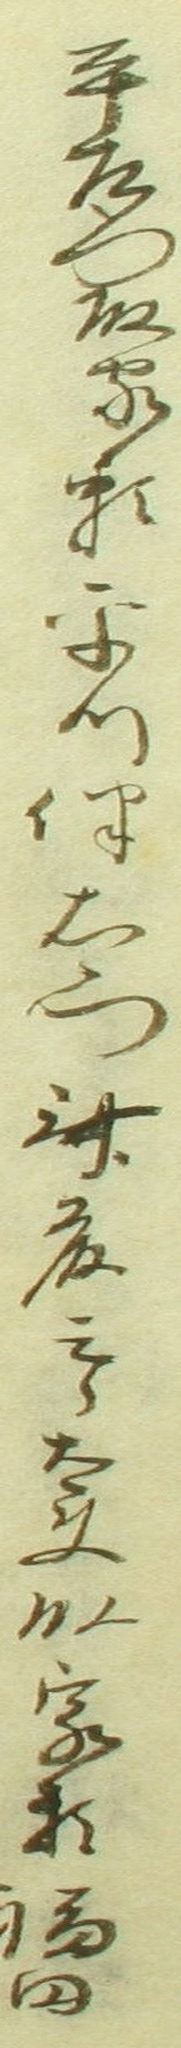平左衛門殿家頼平川伴右衛門斉藤言太夫殿家頼福田
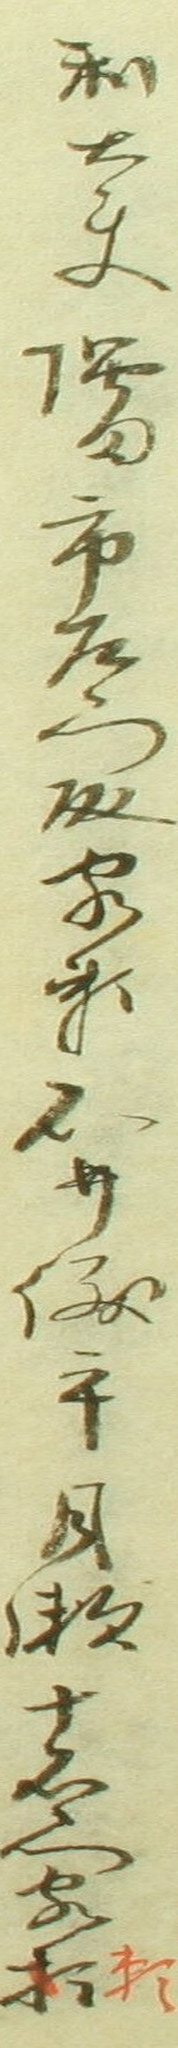利太夫隅田市左衛門殿家頼石井儀平月瀬十右衛門家頼
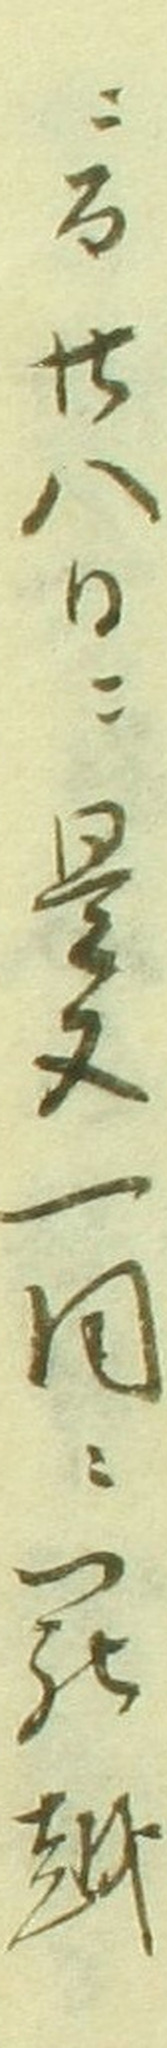ニ而廿八日ニ是又一同ニ罷越
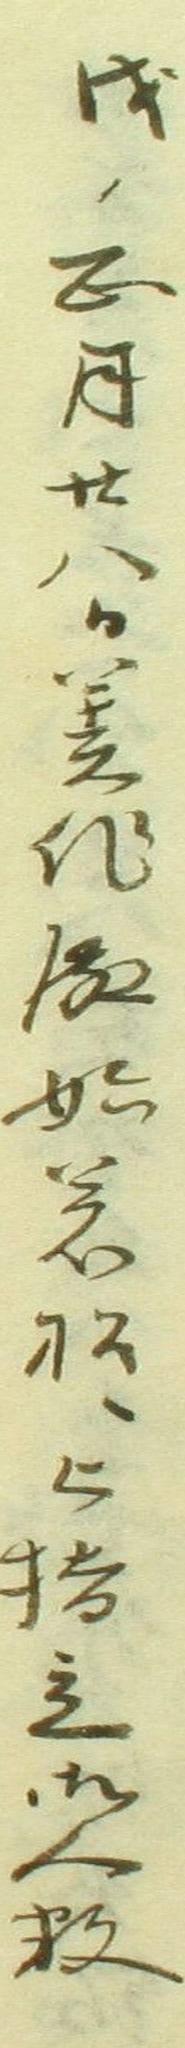戌ノ正月廿八日美作殿始若松へ被指立御人数
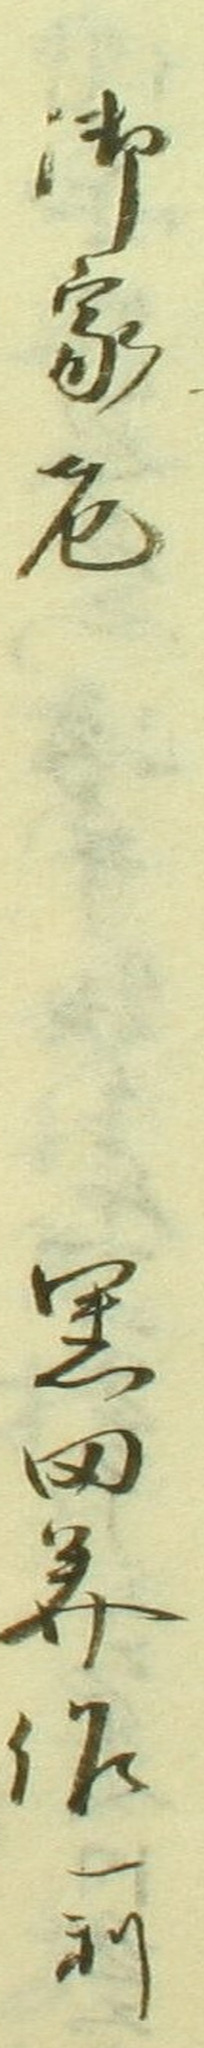御家老黒田美作一利
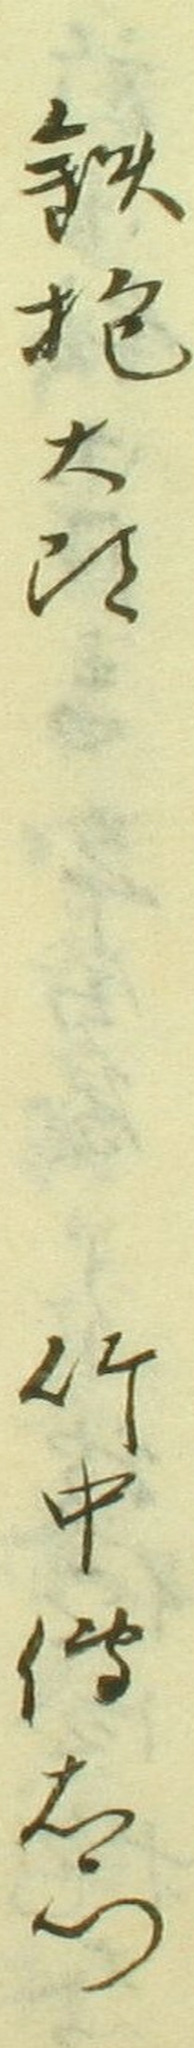鉄砲大頭竹中伝右衛門
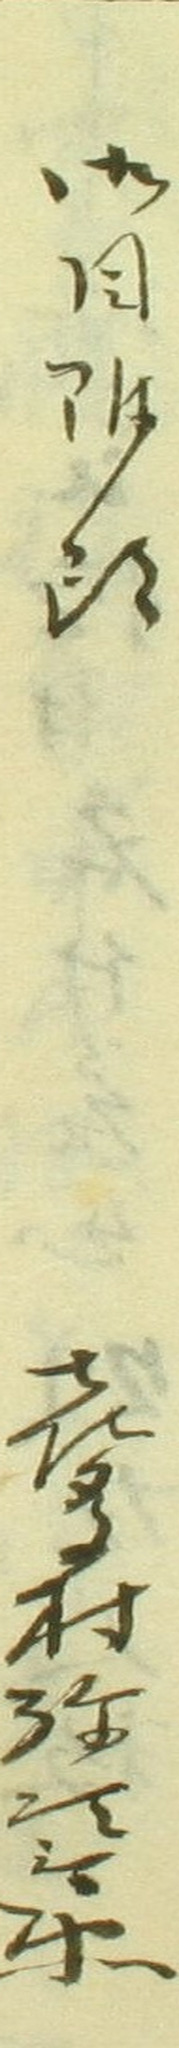御目附頭喜多村弥次兵衛
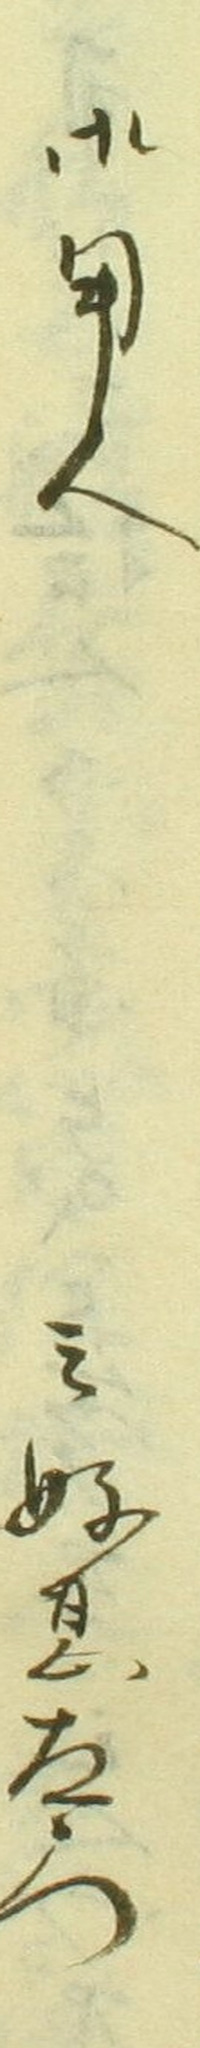御用人三好甚左衛門
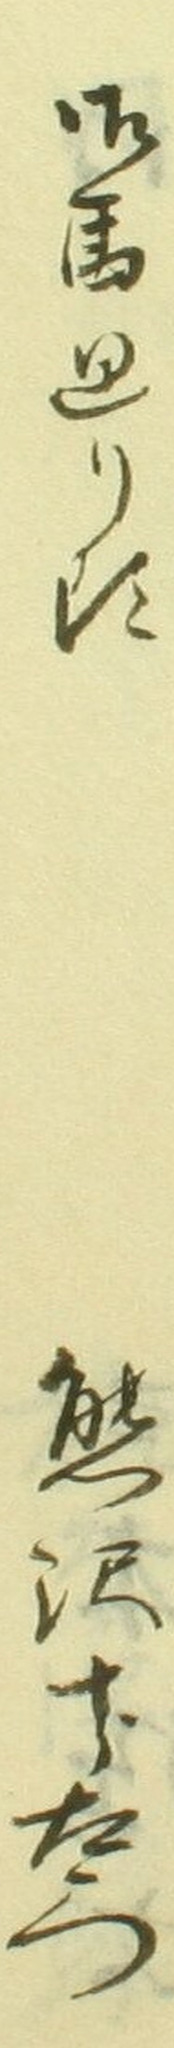御馬廻り頭熊沢十郎左衛門
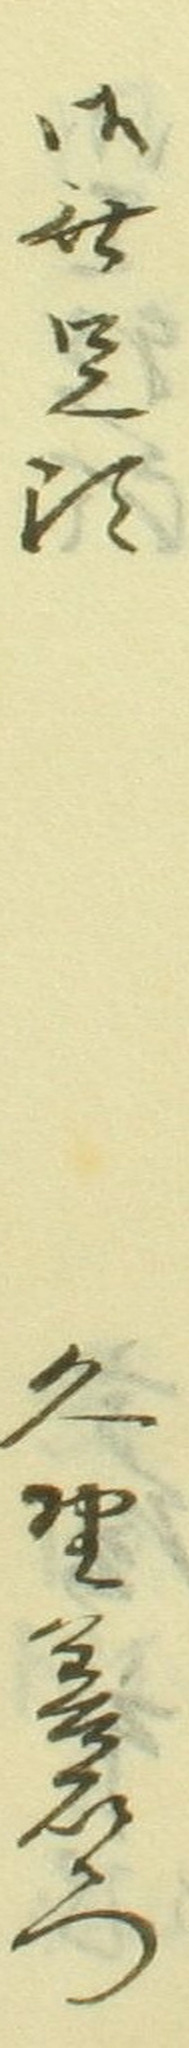御無足頭久野善右衛門
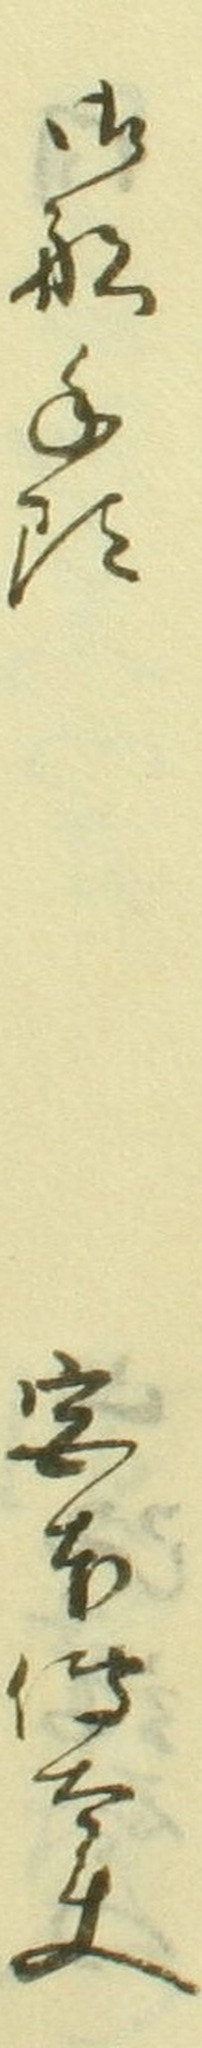御船手頭宮本傳太夫
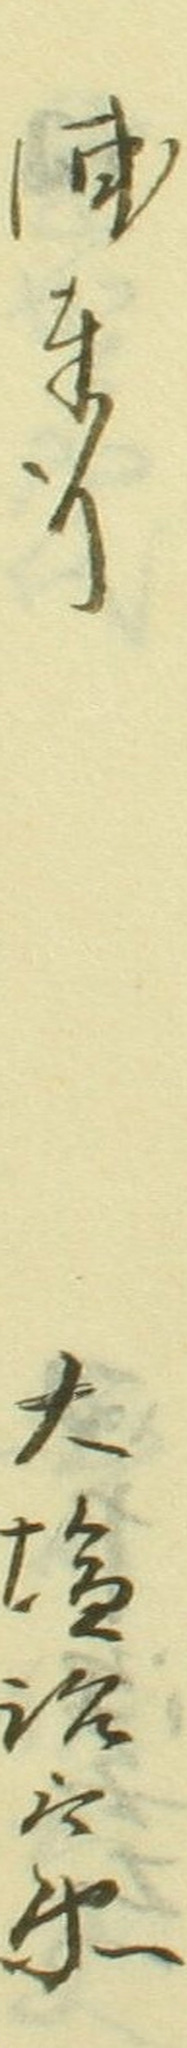浦奉行大塩治兵衛
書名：唐船漂流記 二
